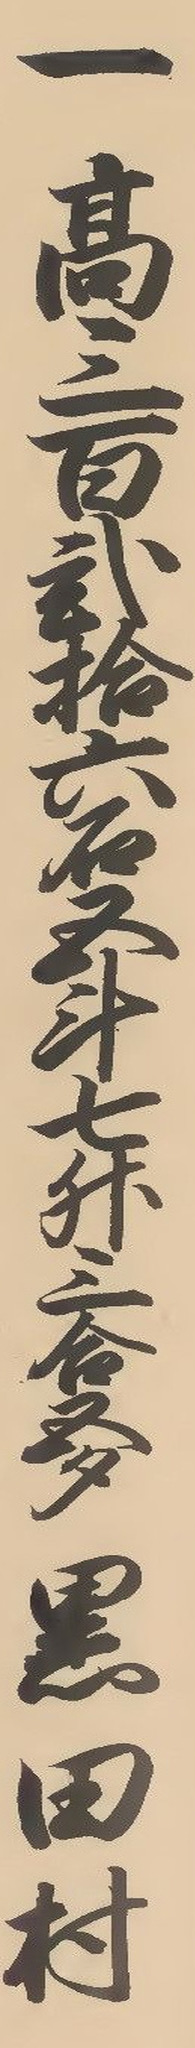一高三百弐拾六石五斗七升三合五勺黒田村
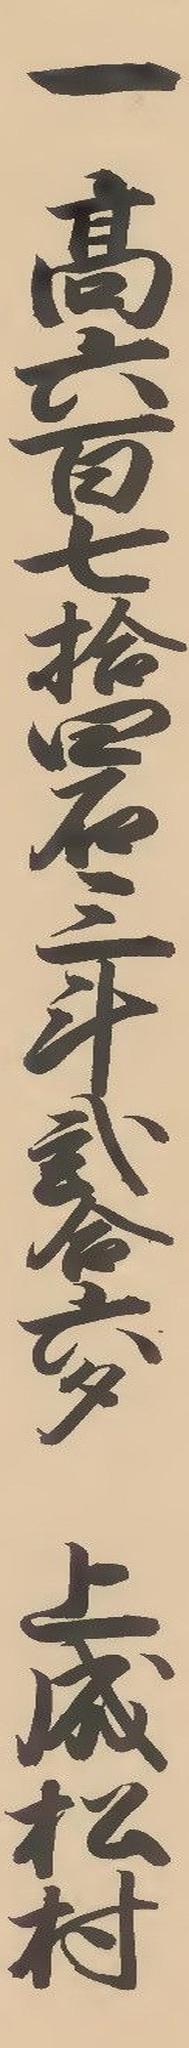一高六百七拾四石三斗弐合六勺上成松村
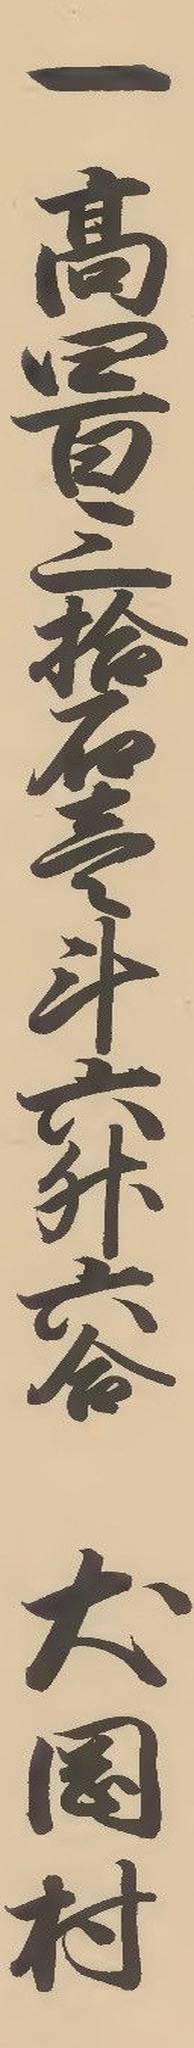一高四百三拾石壱斗六升六合犬岡村
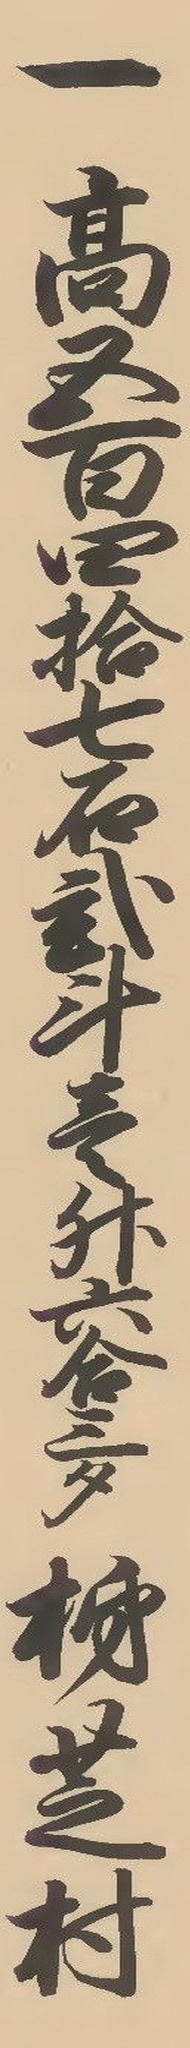一高五百四拾七石弐斗壱升六合三勺柿芝村

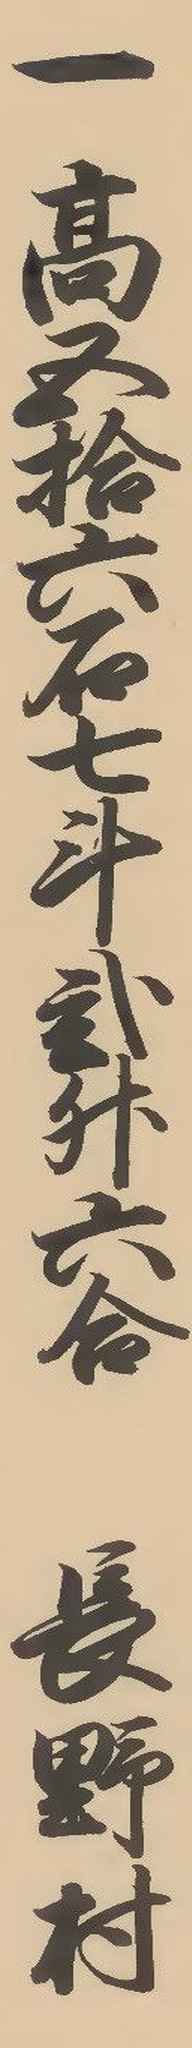一高五拾六石七斗弐升六合長野村
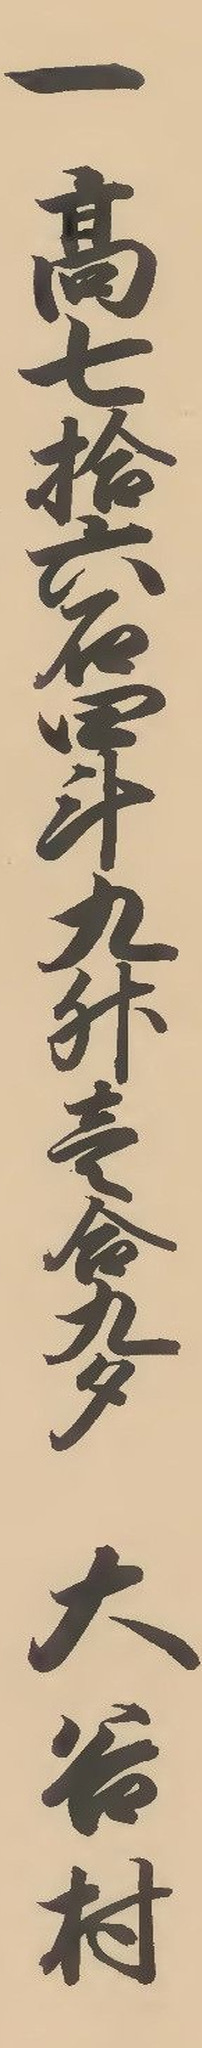一高七拾六石四斗九升壱合九勺大谷村
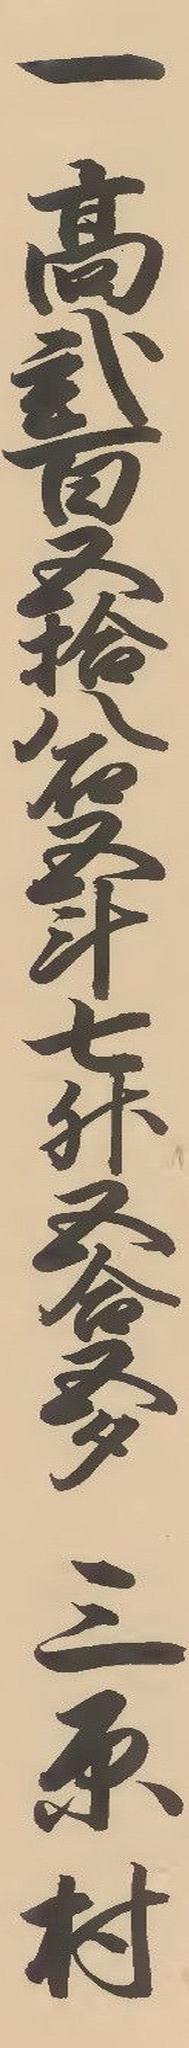一高弐百五拾八石五斗七升五合五勺三原村
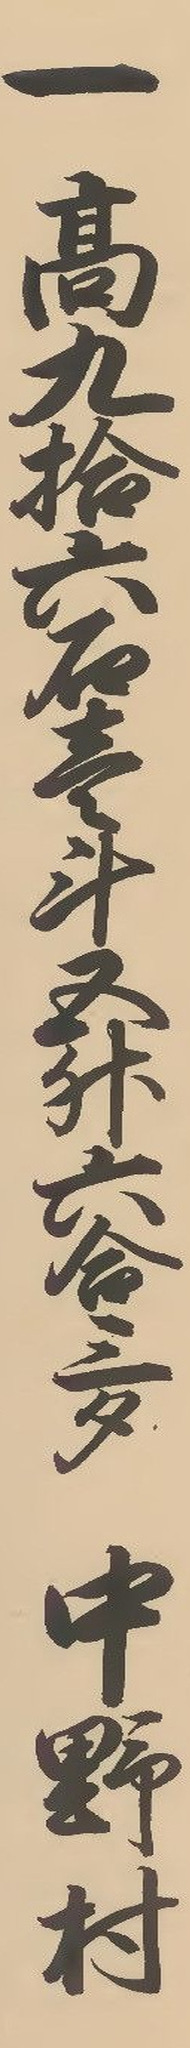一高九拾六石壱斗五升六合三勺中野村
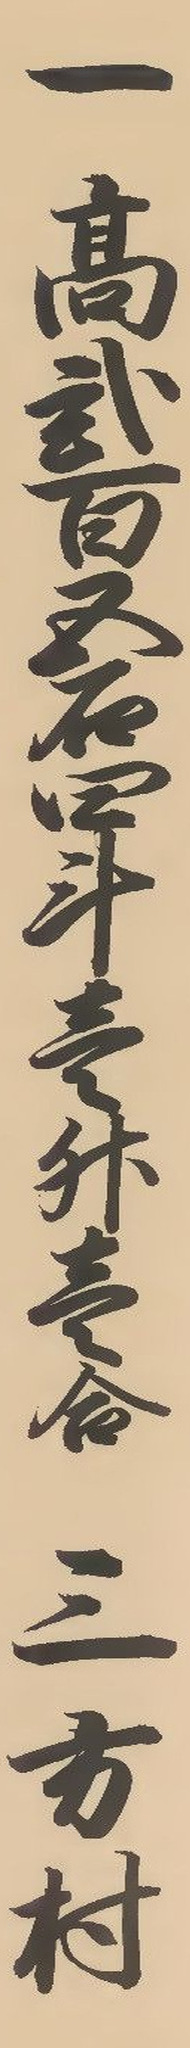一高弐百五石四斗壱升壱合三方村
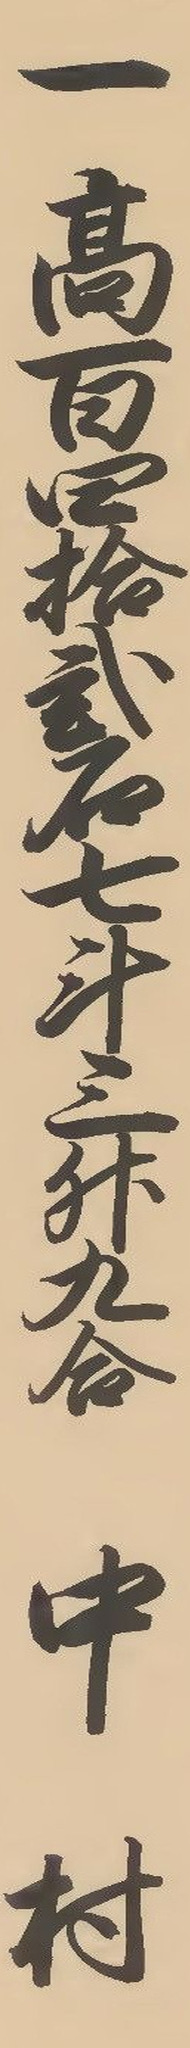一高百四拾弐石七斗三升九合中村
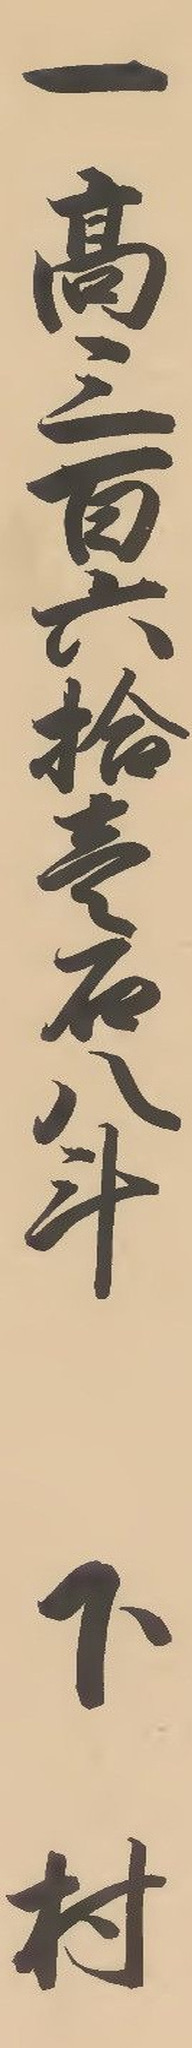一高三百六拾壱石八斗下村
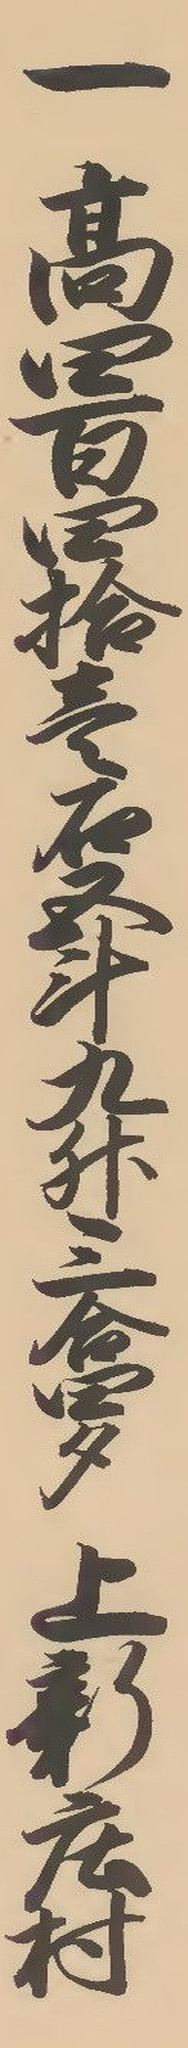一高四百四拾壱石五斗九升三合四勺上新庄村

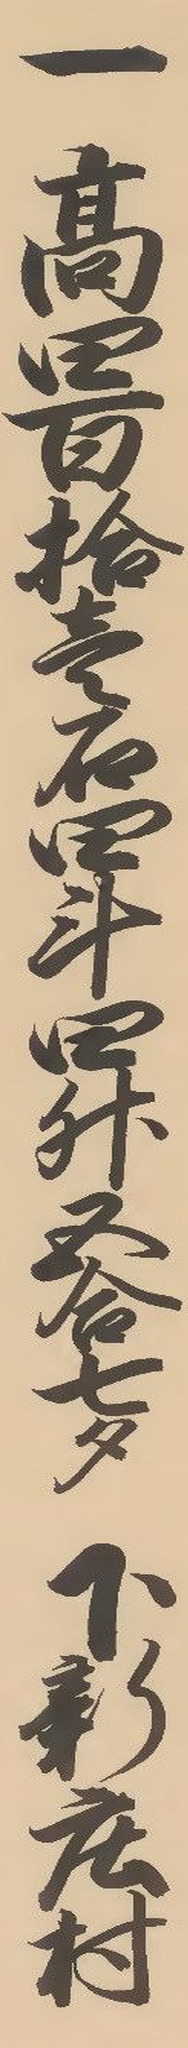一高四百拾壱石四斗四升五合七勺下新庄村
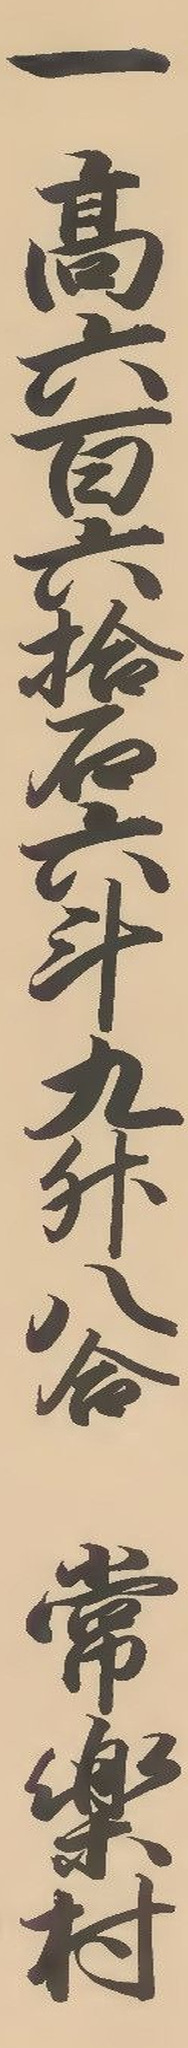一高六百六拾石六斗九升八合常楽村
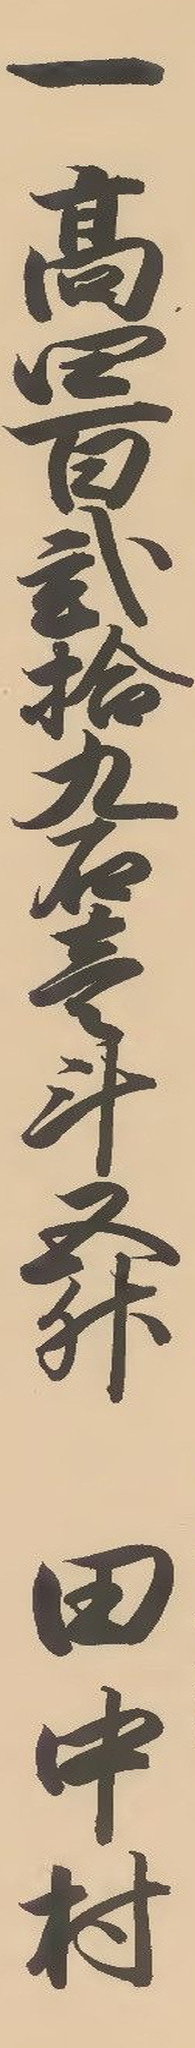一高四百六拾九石九斗三升沼村
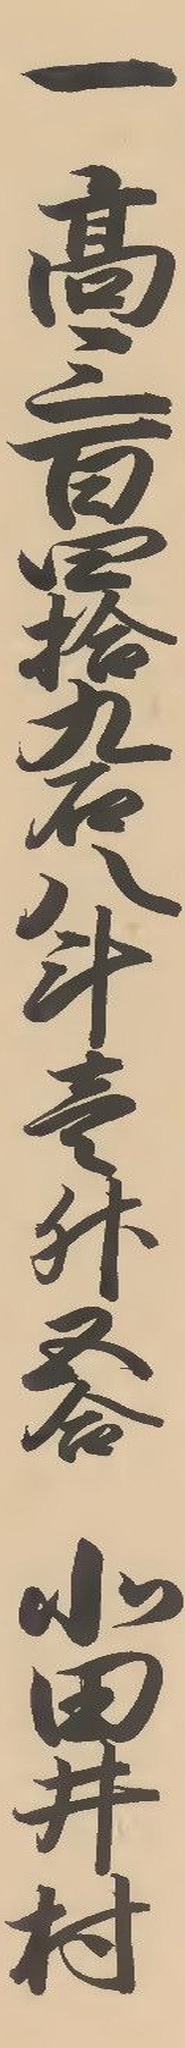一高三百四拾九石八斗壱升五合北田井村
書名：丹波国郷帳
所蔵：国立公文書館 National Archives of Japan
